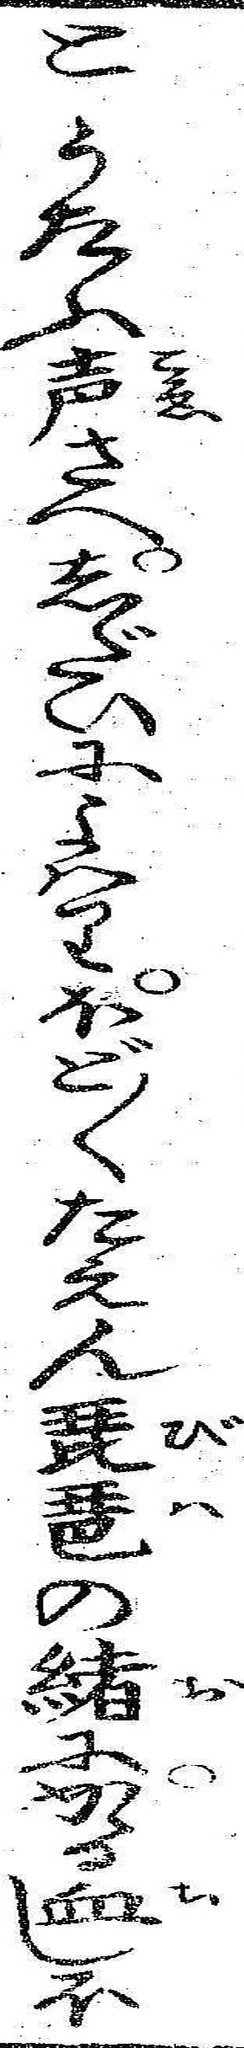とうたふ声さへ。しだいによはり。ほど〳〵たえん琵琶の緒に。かゝる血しほ
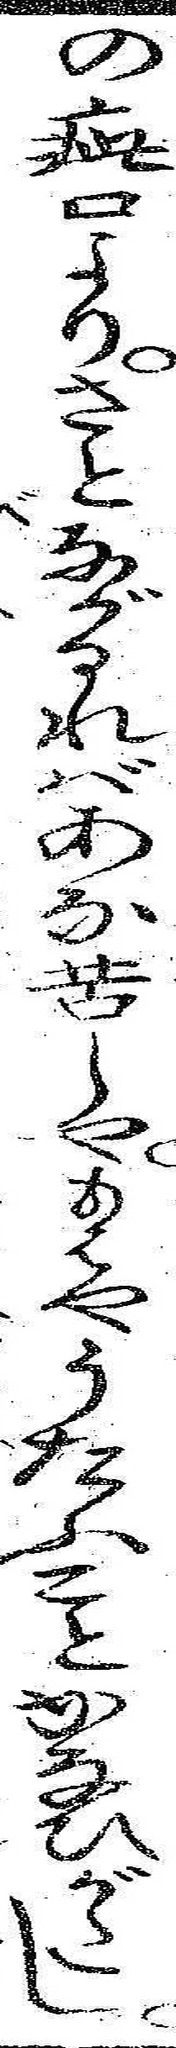の疵口より。さとながるればあな苦しや。もはやうたふことかなひがたし。
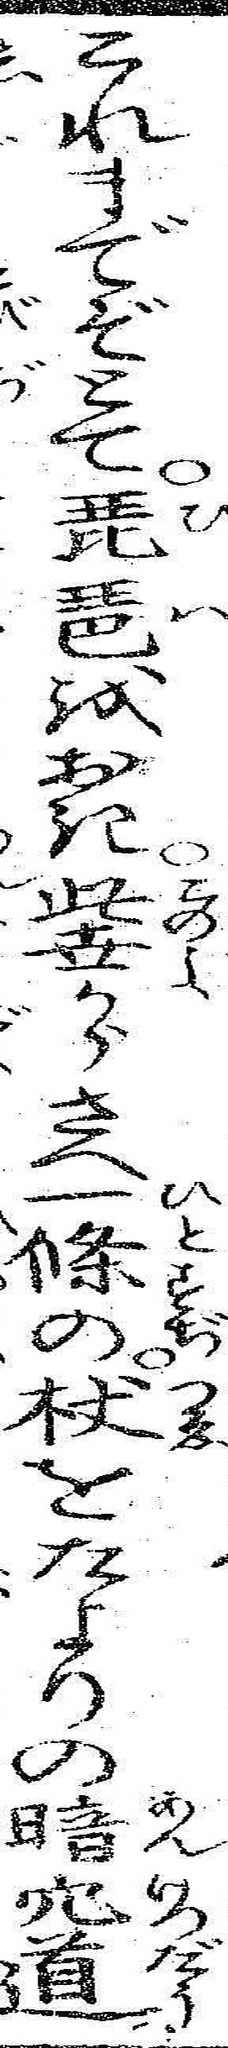これまでぞとて。琵琶をおき。此世からさへ一条の。杖をたよりの暗穴道。
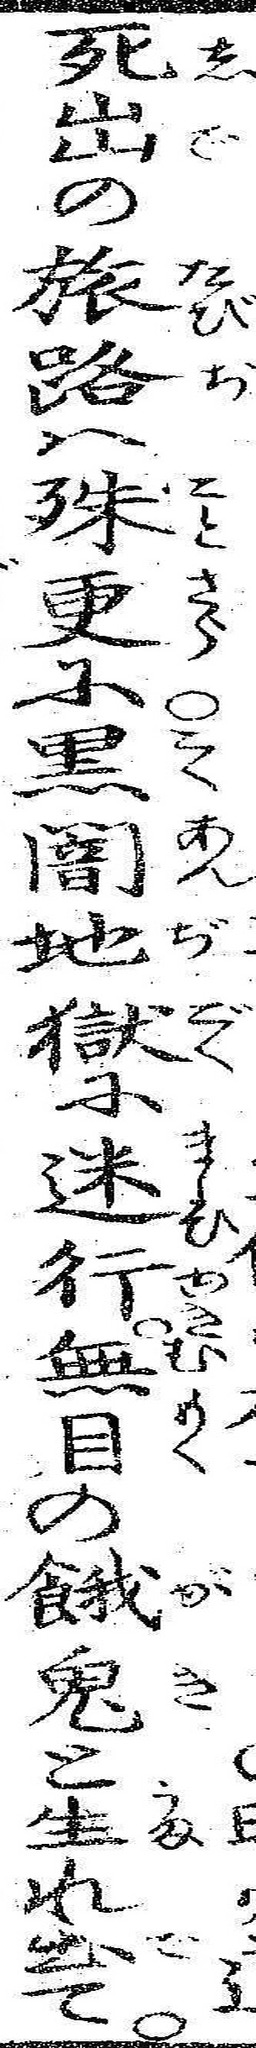死出の旅路は殊更に。黒闇地獄に迷行。無目の餓鬼と生れ出て。
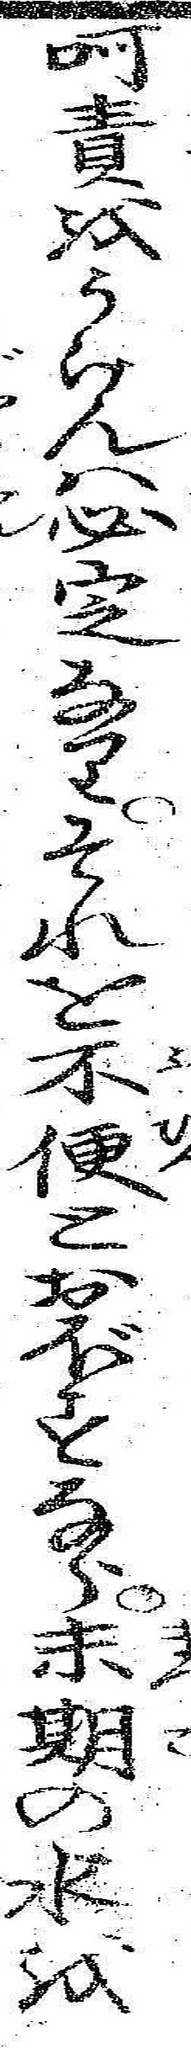呵責をうけんは必定なり。それを不便とおぼすなら。末期の水を
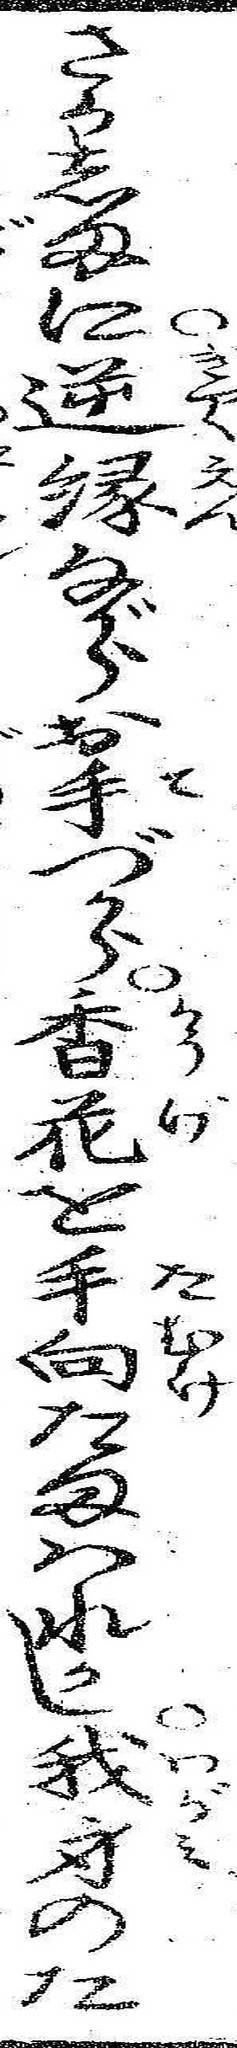さかしまに。逆縁ながらお手づから。香花を手向たまはれかし。我身のた
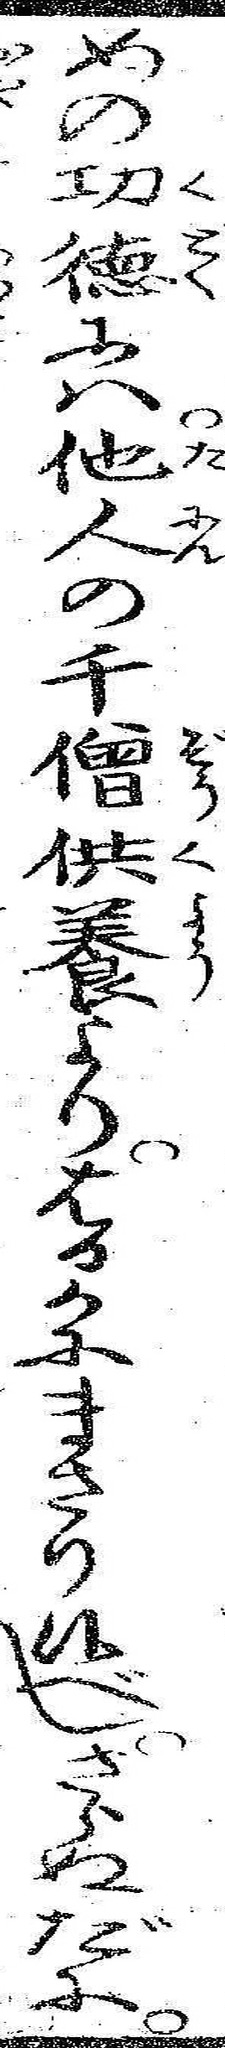めの功徳には。他人の千僧供養より。はるかにまさり候べし。さらぬだに。
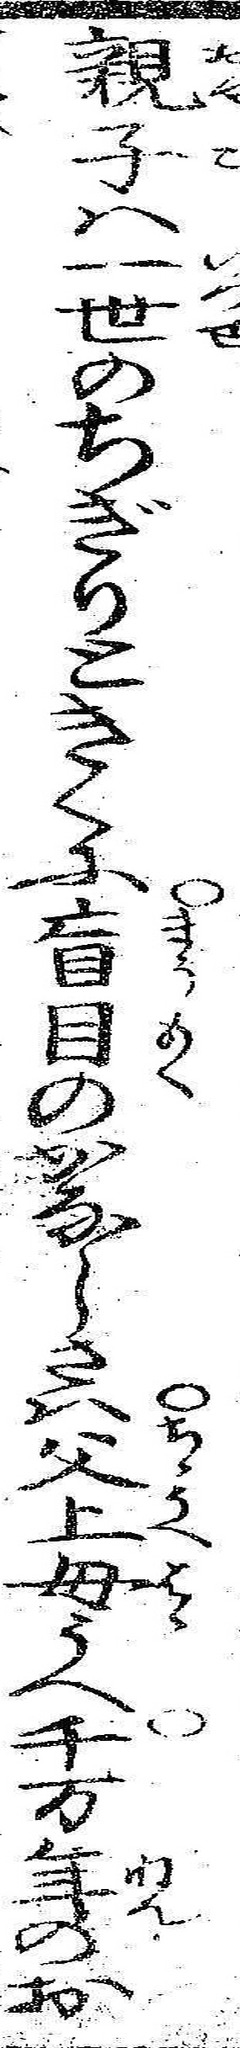親子は一世のちぎりときくに。盲目のかなしさは。父上母うへ。千万年のお
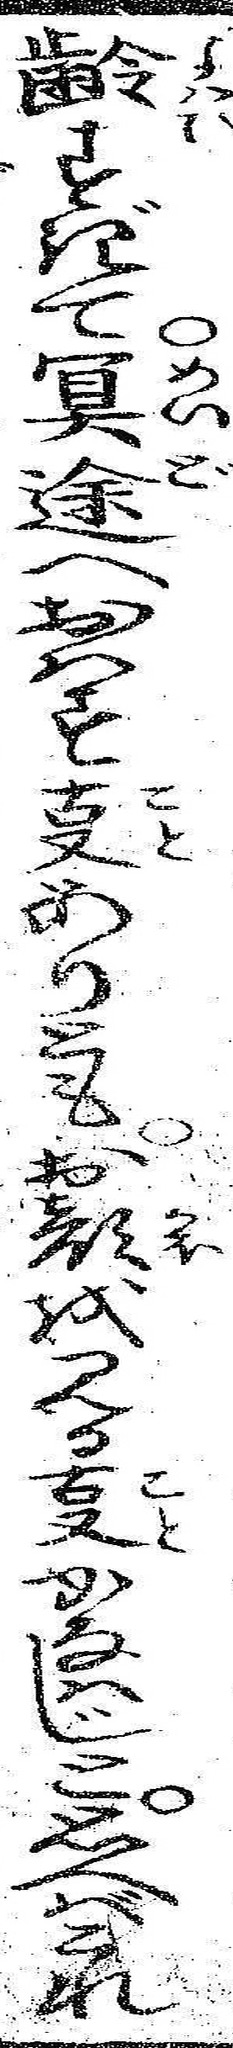齢すぎて。冥途へおはす事ありとも。お顔を見る事かなはじと。思へばこれ
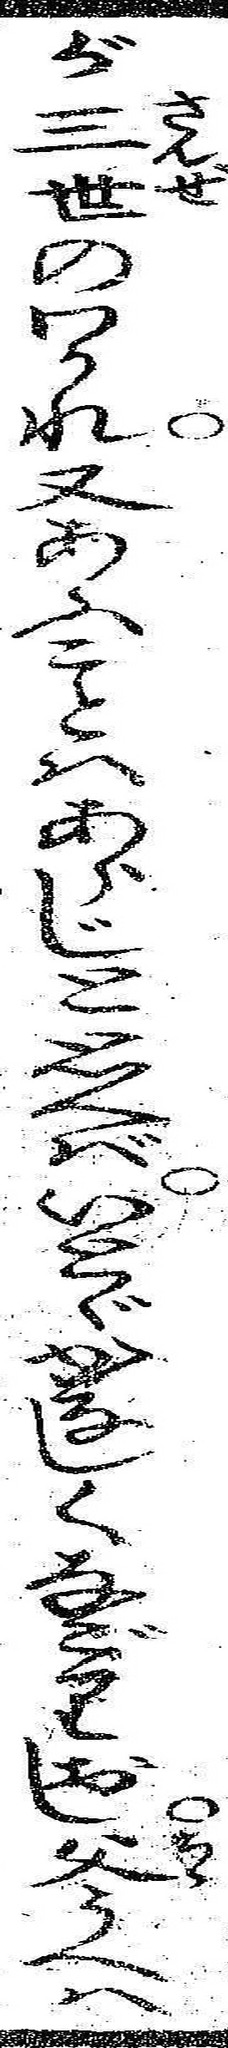が三世のわかれ。又あふことはあらじと思へば。いとゞかなしくなごりおし。父うへは

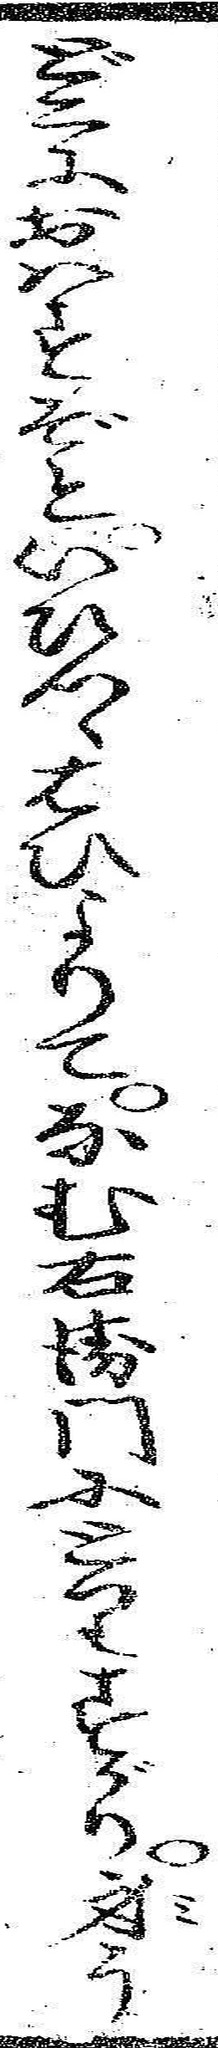どこにおはすぞと。いひつゝはひよりて。なむ右衛門にとりすがり。身う
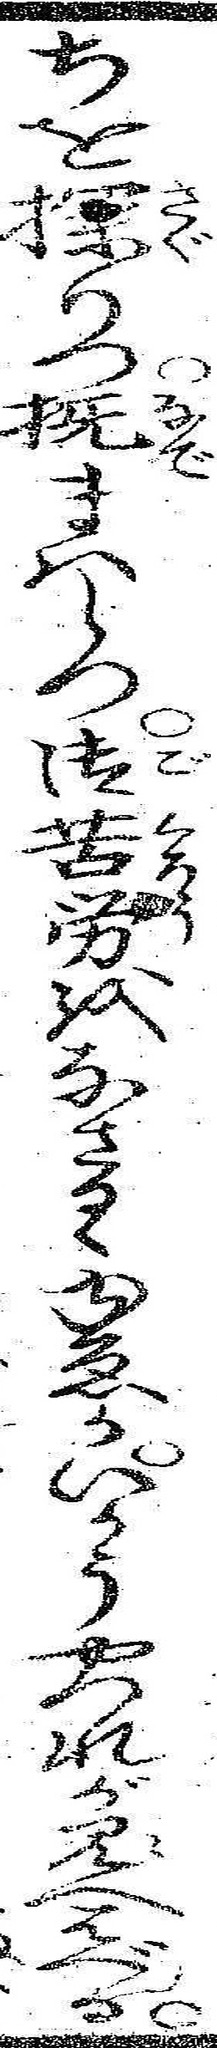ちを探りつ。撫まはしつ。御苦労をなさるゝゆゑか。いかうやつれが見へはべる。
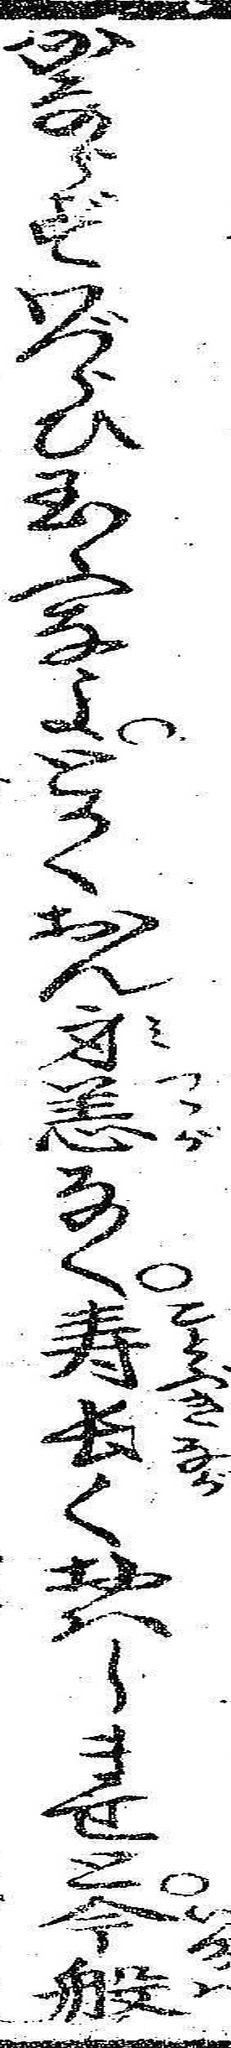かならずわづらひ玉ふなよ。とかくおん身恙なく。寿長くおはしませと。今般
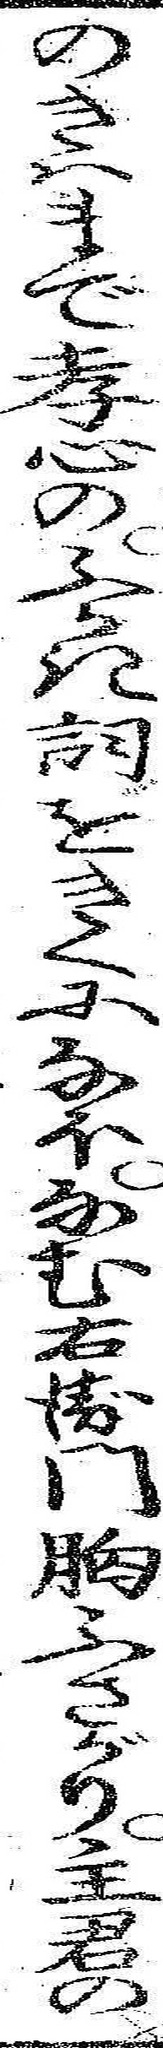のきはまで孝心の。ふかき詞をきくになほ。なむ右衛門胸ふさがり。主君の
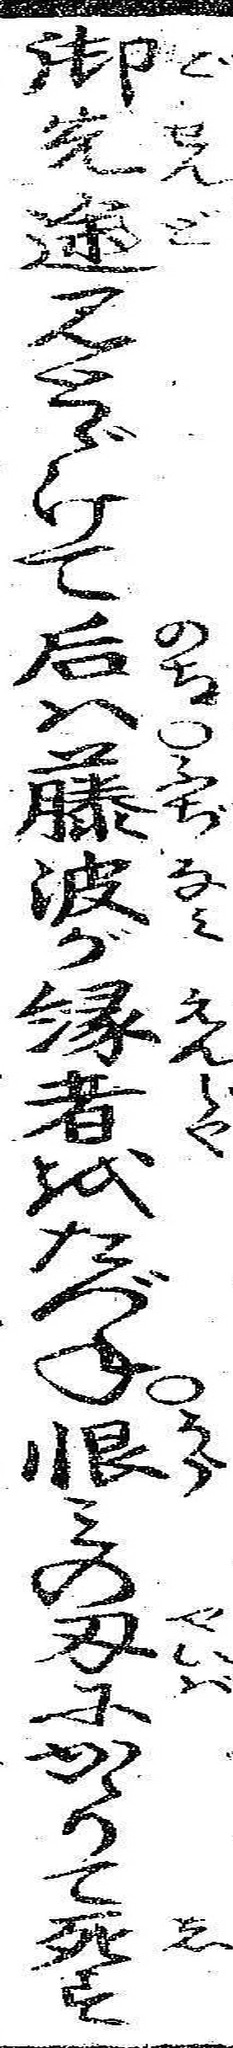御先途見とゞけて后は。藤波が縁者をたづね。恨みの刃にかゝりて死す
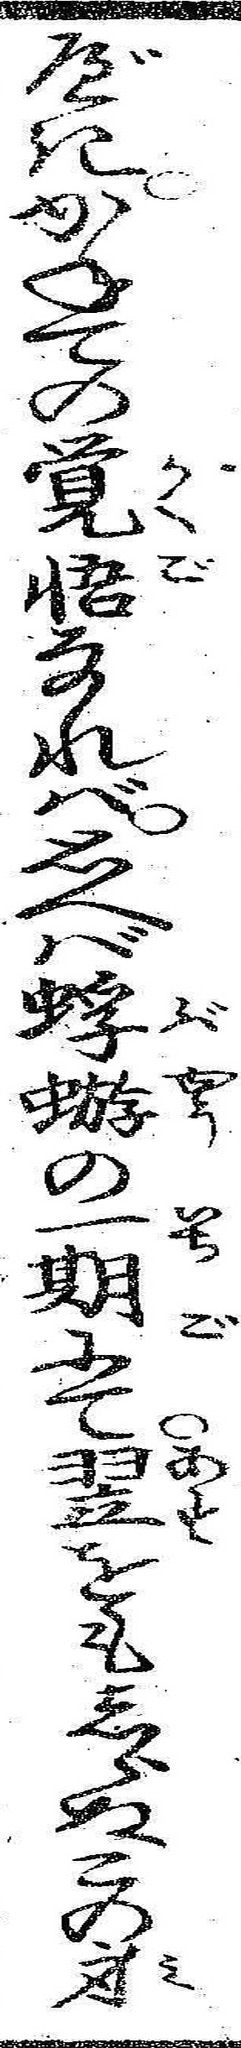べき。かねての覚悟なれば。思へば蜉蝣の一期にて。翌をもしらぬこの身
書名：昔話稲妻表紙
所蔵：国文学研究資料館
